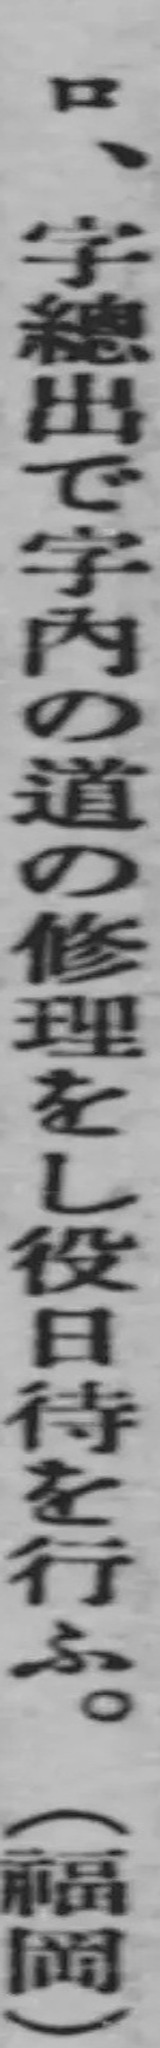ロ、字總出で字内の道の修理をし役日待を行ふ。(福岡)
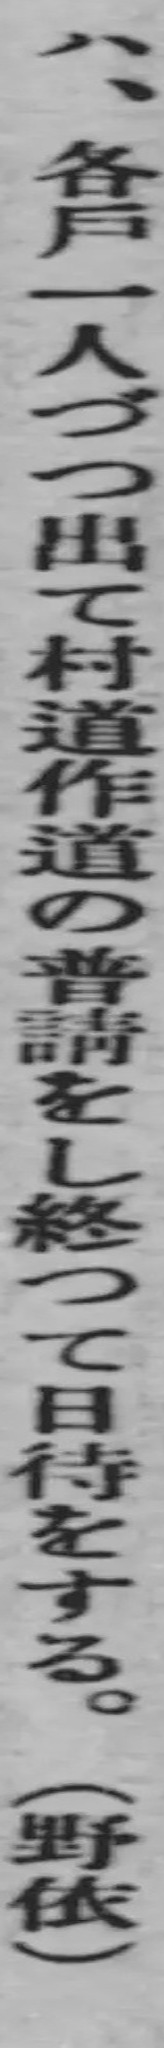ハ、各戸一人づつ出て村道作道の普請をし終つて日待をする。(野依)
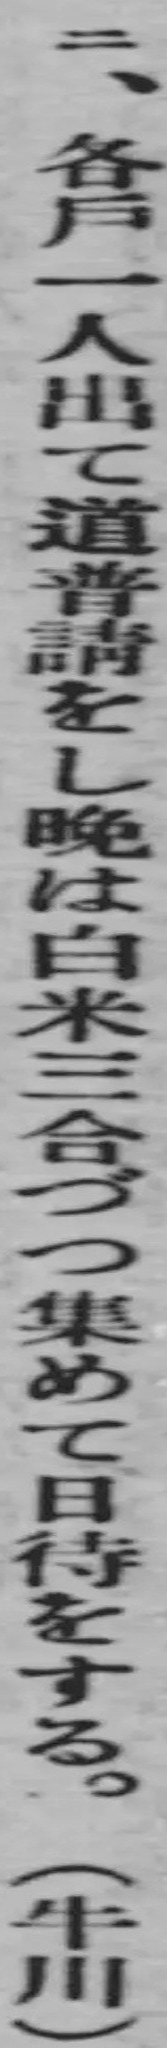ニ、各戸一人出て道普請をし晩は白米三合づつ集めて日待をする。(牛川)

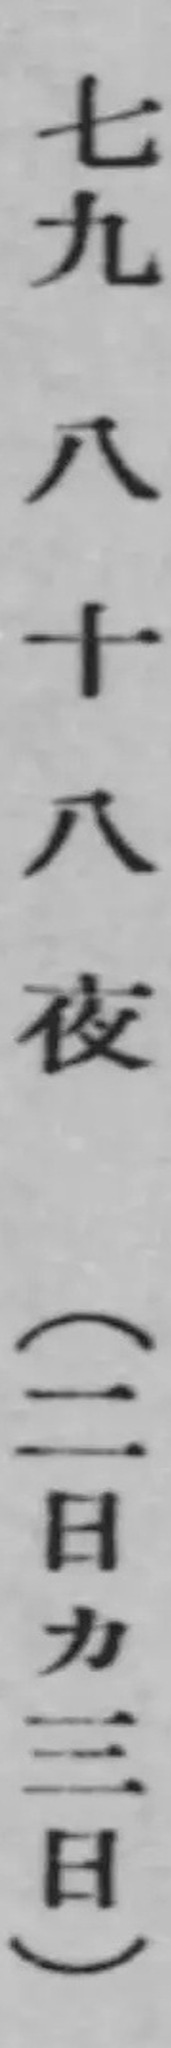七九(八十八夜)(二日ヵ三日)
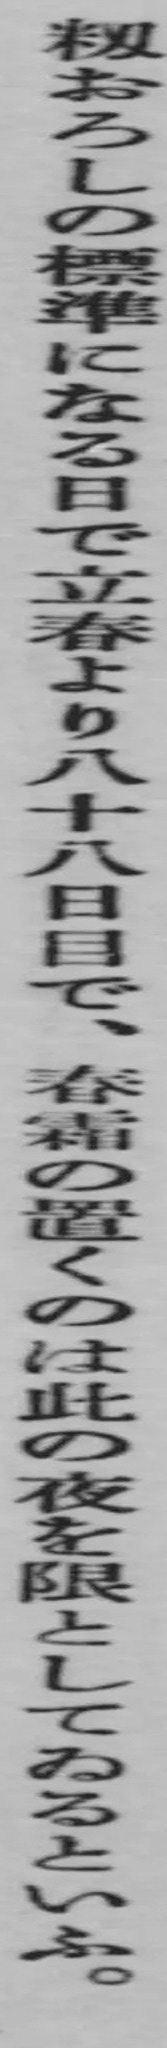籾おろしの標準になる日で立春より八十八日目で、春霜の置くのは此の夜を限としてゐるといふ。
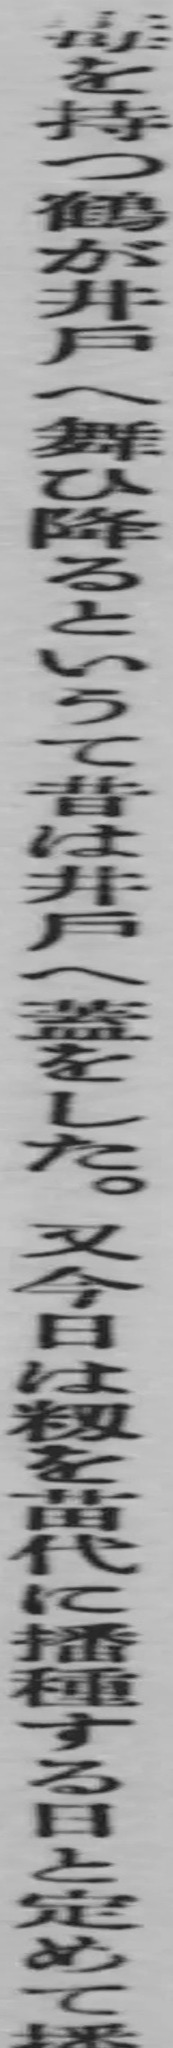毒を持つ鶴が井戸へ舞ひ降るというて昔は井戸へ蓋をした。又今日は籾を苗代に播種する日と定めて播
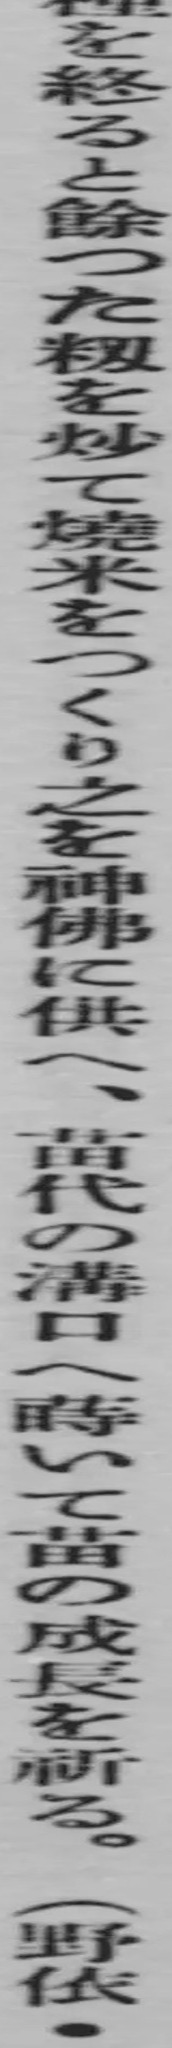種を終ると餘つた籾を炒て燒米をつくり之を神佛に供へ、苗代の溝口へ蒔いて苗の生長を祈る。(野依・
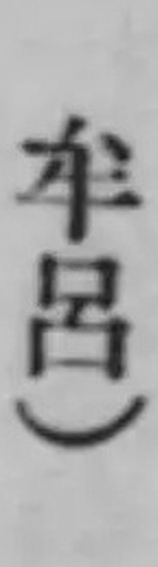牟呂)
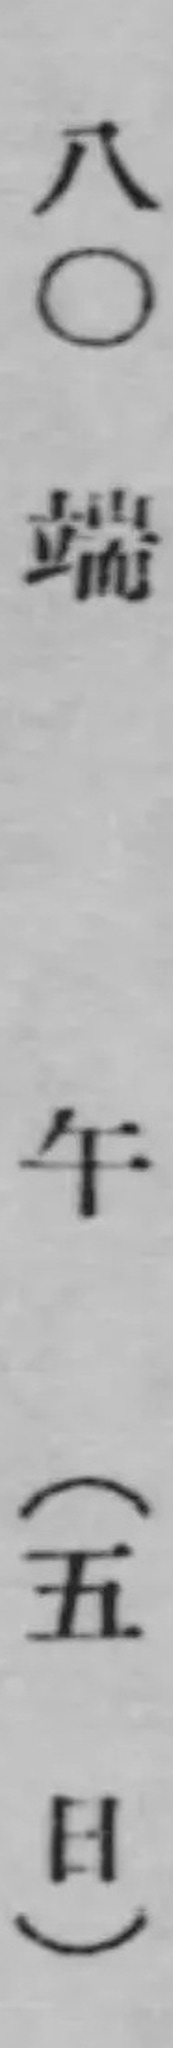八〇端午(五日)
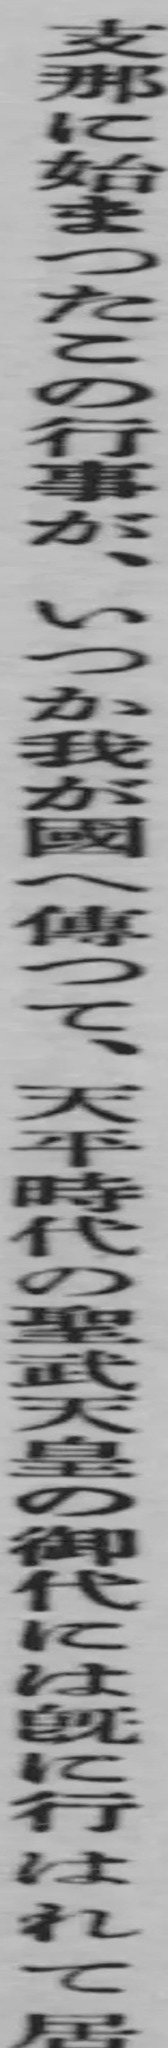支那に始まつたこの行事が、いつか我が國へ傳つて、天平時代の聖武天皇の御代には旣に行はれて居
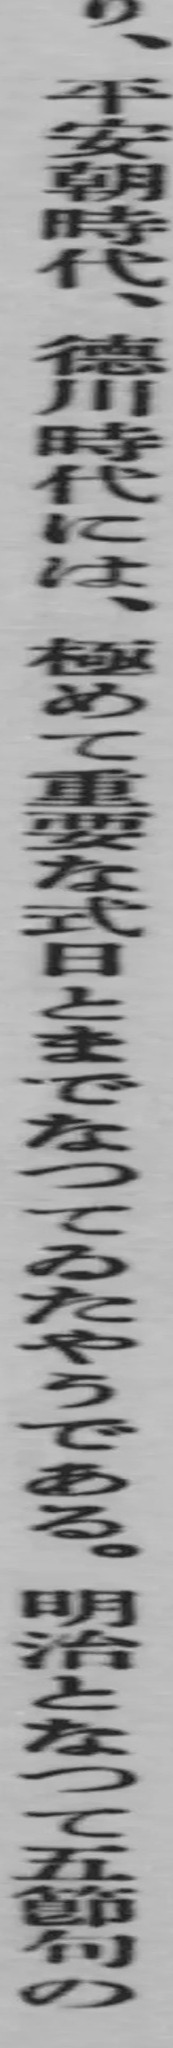り、平安朝時代、德川時代には、極めて重要な式日とまでなつてゐたやうである。明治となつて五節句の
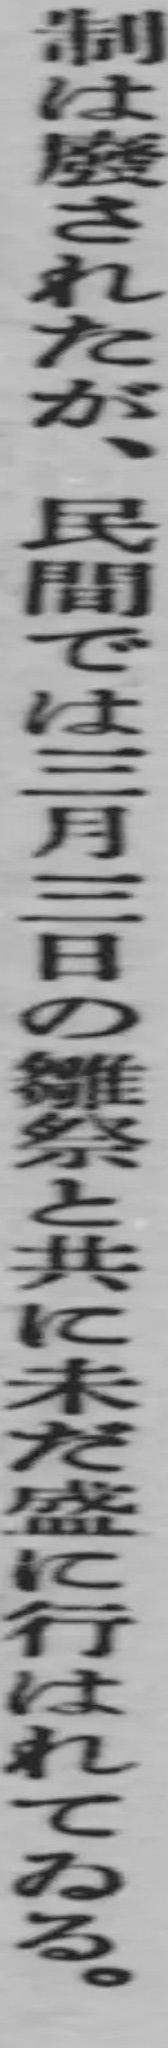制は廢されたが、民間では三月三日の雛祭と共に未だ盛に行はれてゐる。
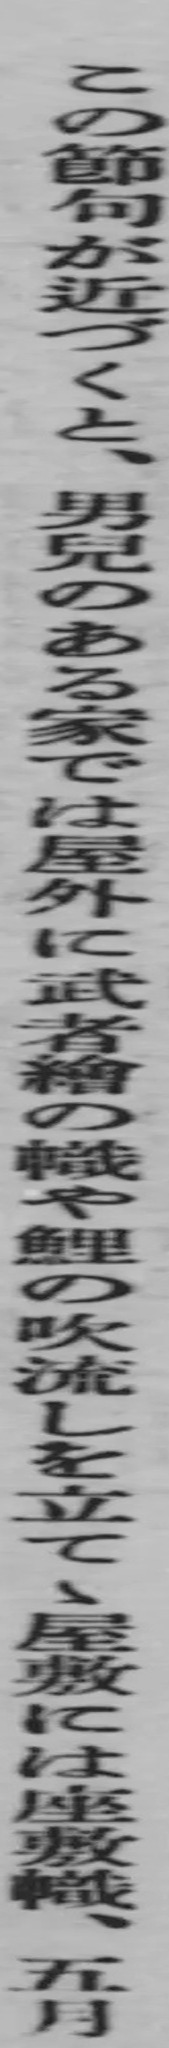この節句が近づくと、男兒のある家では屋外に武者繪の幟や鯉の吹流しを立てゝ屋敷には座敷幟、五月
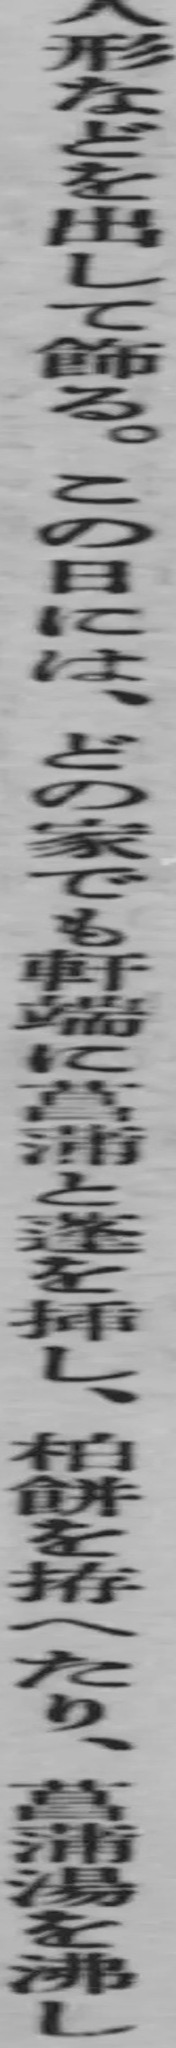人形などを出して飾る。この日には、どの家でも軒端に菖蒲と蓬を挿し、柏餅を拵へたり、菖蒲湯を沸し
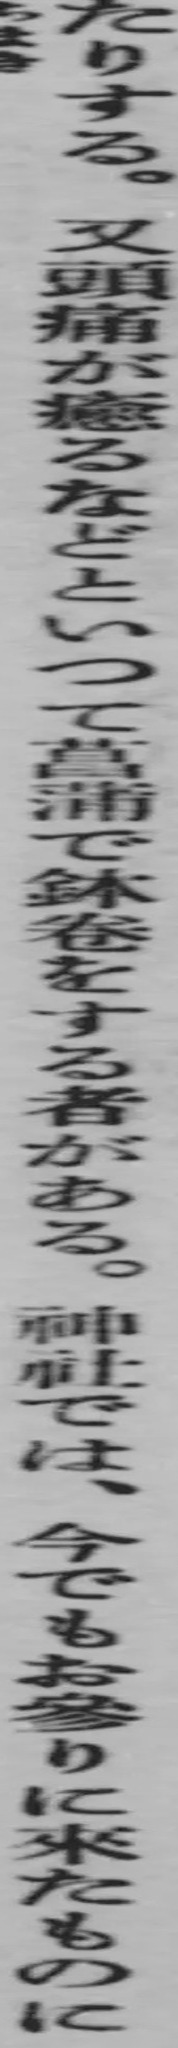たりする。復頭痛が癒るなどといつて菖蒲で鉢卷をする者がある。神社では、今でもお參りに來たものに
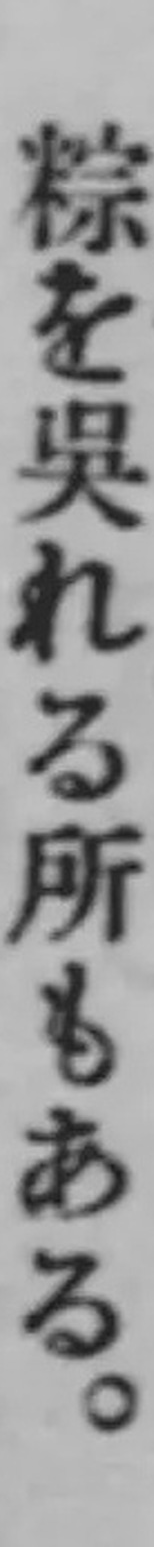粽を吳れる所もある。
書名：豊橋の年中行事
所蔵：国立国会図書館 National Diet Library, JAPAN
